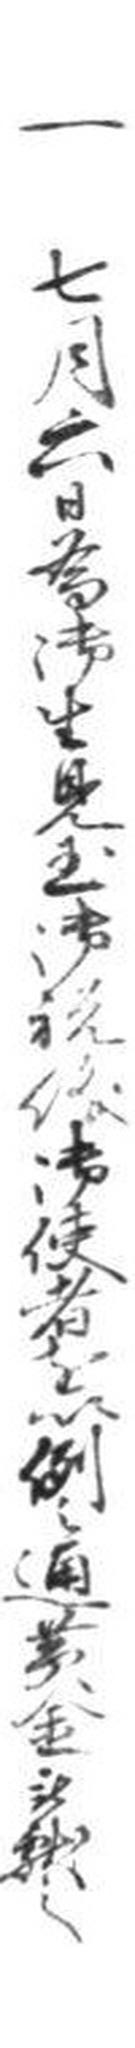一七月六日為生見玉御祝儀御使者を以例之通黄金被献之
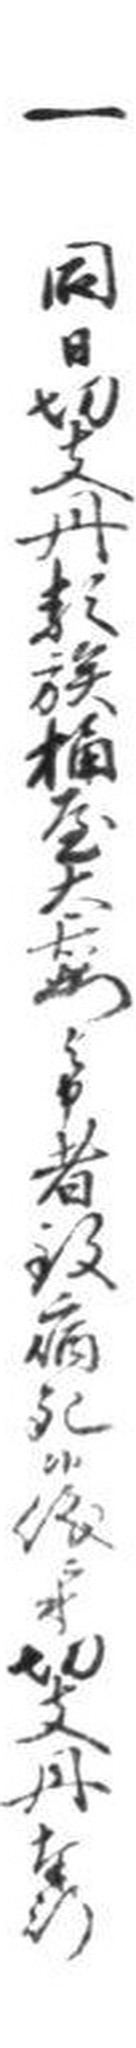一同日切支丹類族桶屋太右衛門と申者致病死候儀ニ付切支丹奉行
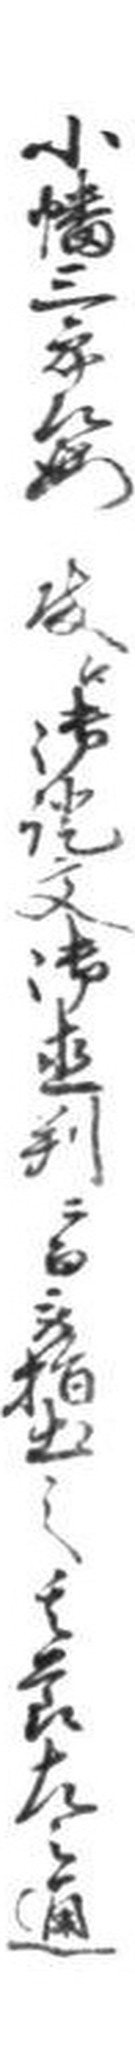小幡三郎左衛門殿江御証文御直判ニ而被指出之其節左之通
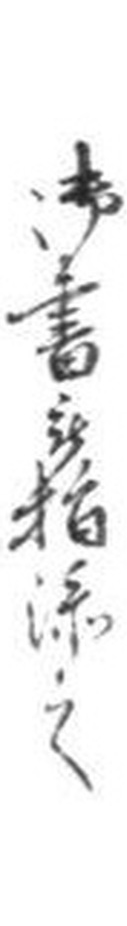御書被指添之
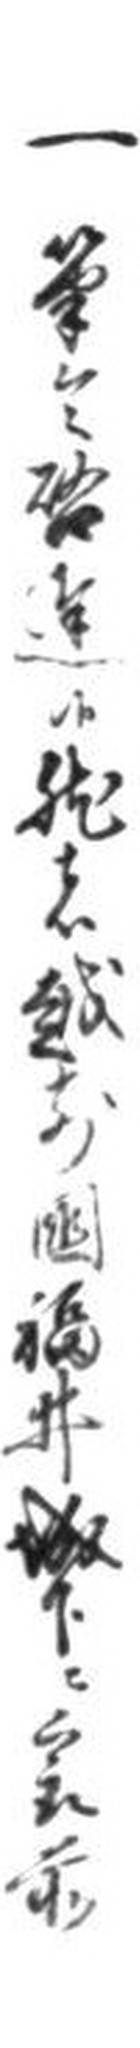一筆令啓達候然者越前国福井城下ニ最前
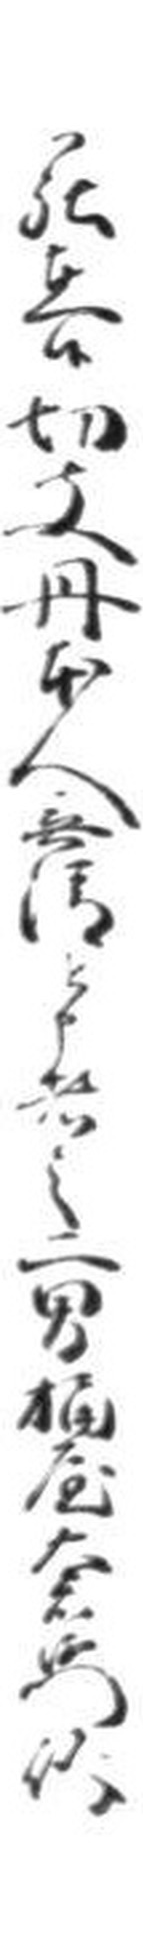罷在切支丹本人無清と申者之二男桶屋太右衛門儀
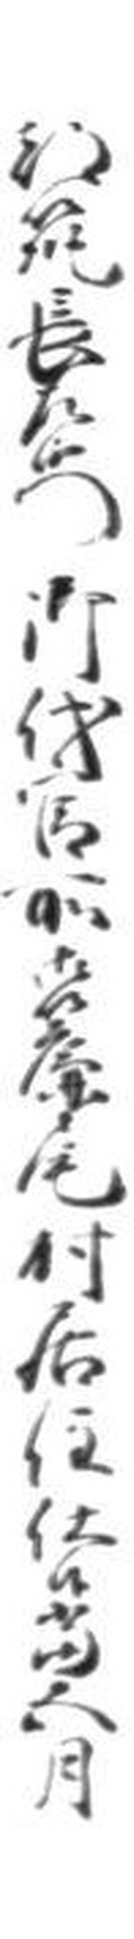都筑長左衛門御代官所御簾尾村居住仕候当五月
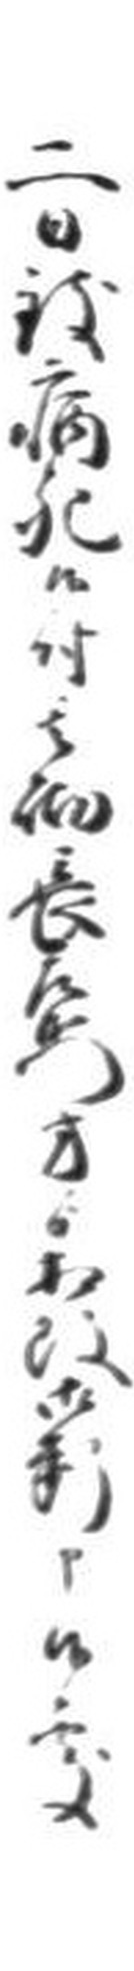二日致病死候付其砌長左衛門方ゟ相改御断申候処
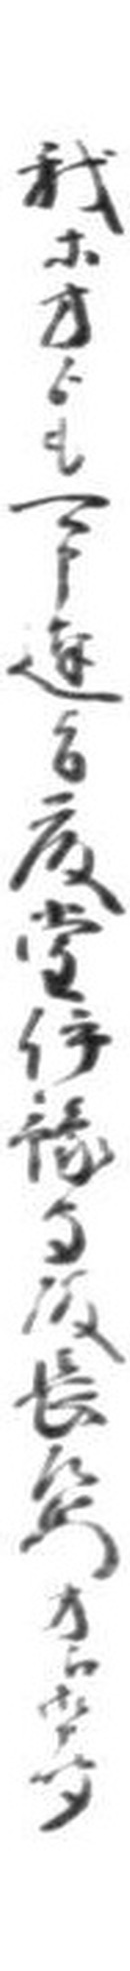我等方ゟも可申達旨藤堂伊予守殿長左衛門方江御申聞
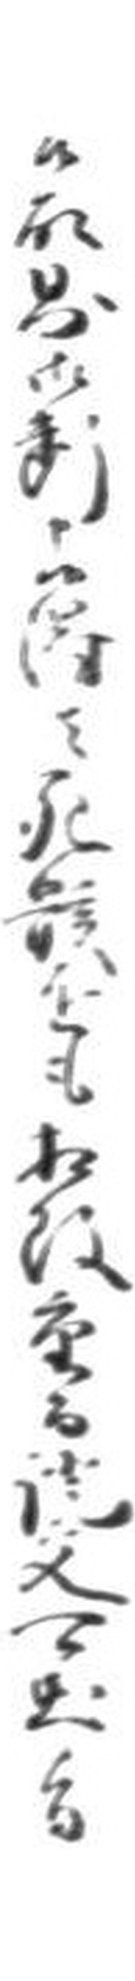候故則御断申候得者死骸をも相改重而証文可出旨
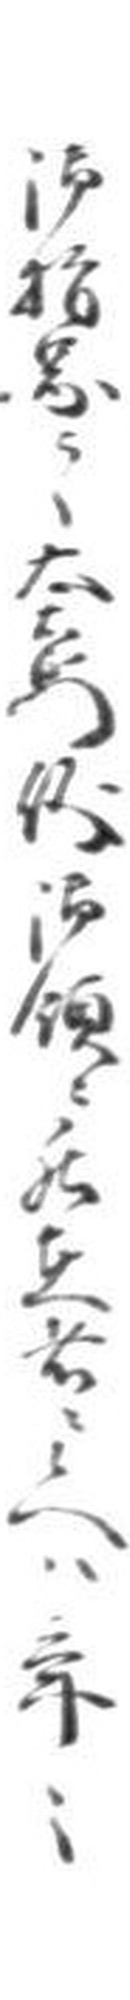御指図之太右衛門儀御領ニ罷在者ニ候ヘハ年々
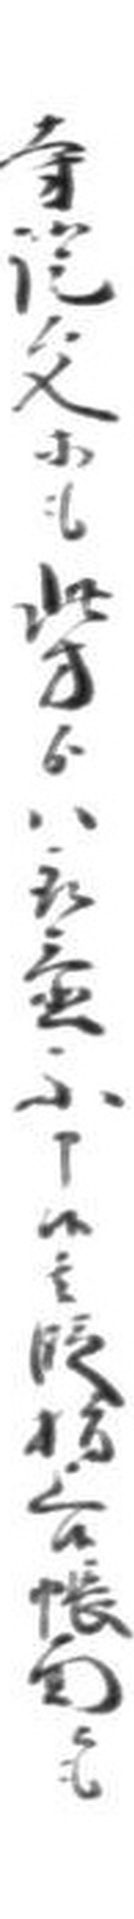寺証文にも此方ゟハ取置不申候其段指上候帳面ニも
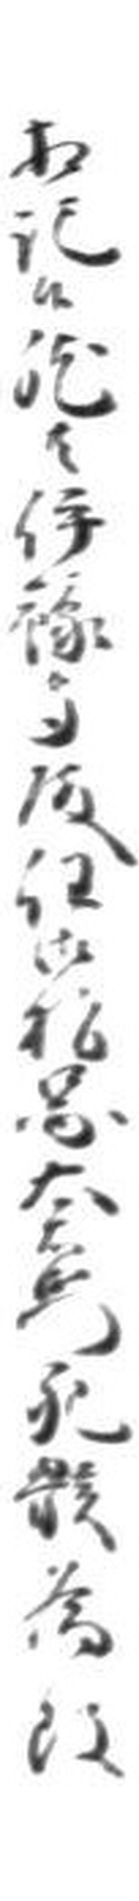相記候然共伊予守殿任御指図太右衛門死骸為改
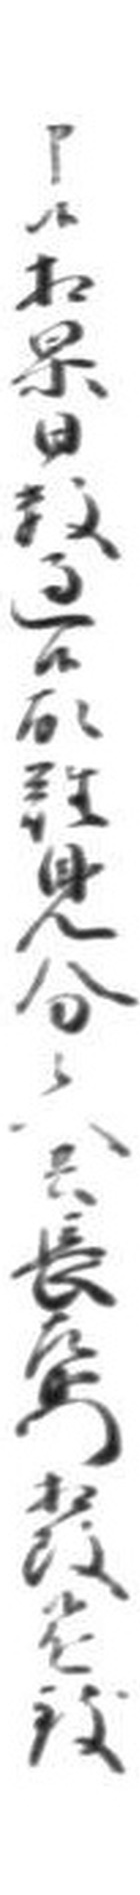申候相果日数過候故難見分候ヘ共長左衛門相改候を致

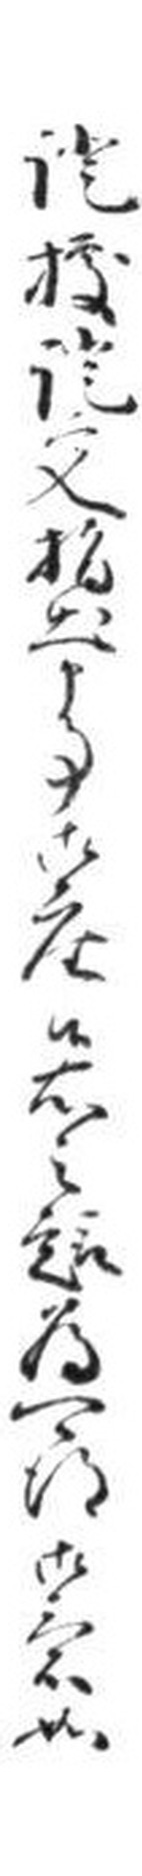証拠証文指出申事御座候右之趣為可得御意如
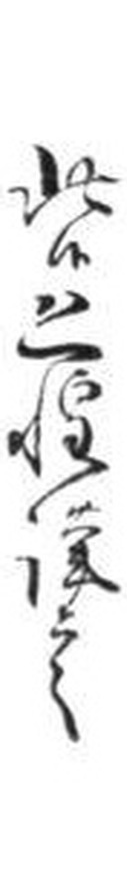此候恐惶謹言
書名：家譜 十七 吉品公 従元禄元年到同二年
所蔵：福井県文書館 Fukui Prefectural Archives
